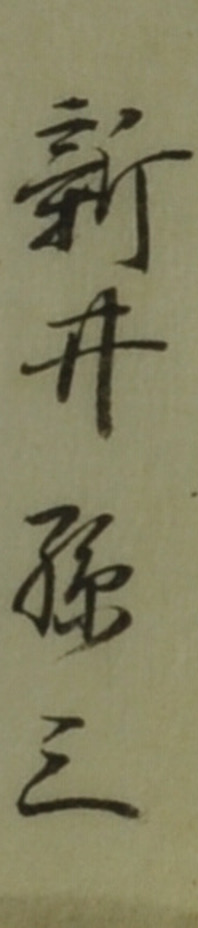新井孫三
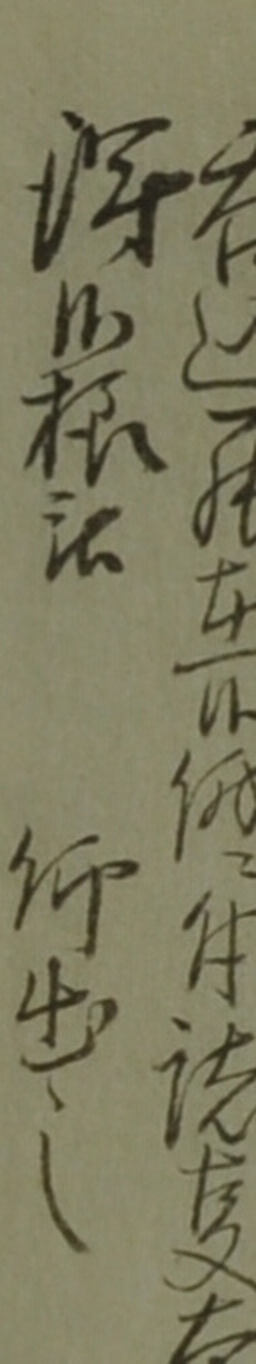得候様被仰出之

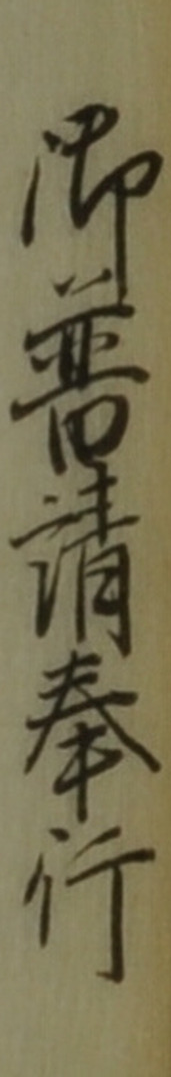御普請奉行
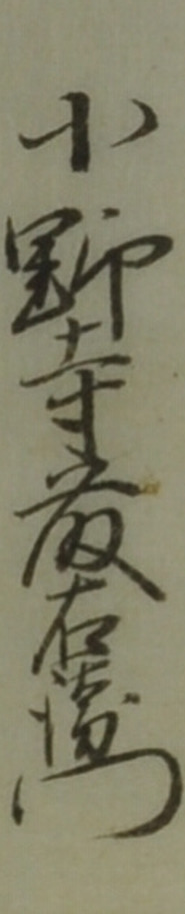小野寺藤右衛門
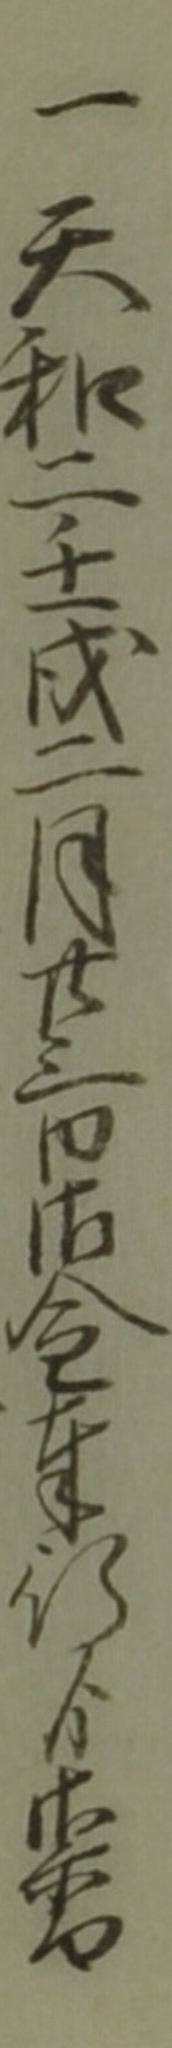一天和二壬戌二月廿三日御金奉行ゟ御普
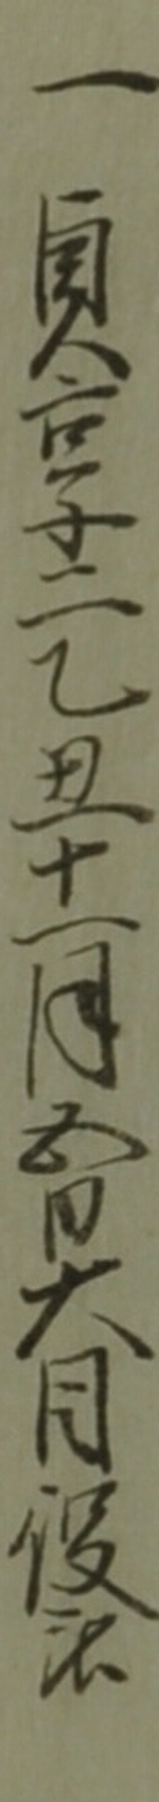一貞享二乙丑十一月五日大目役被
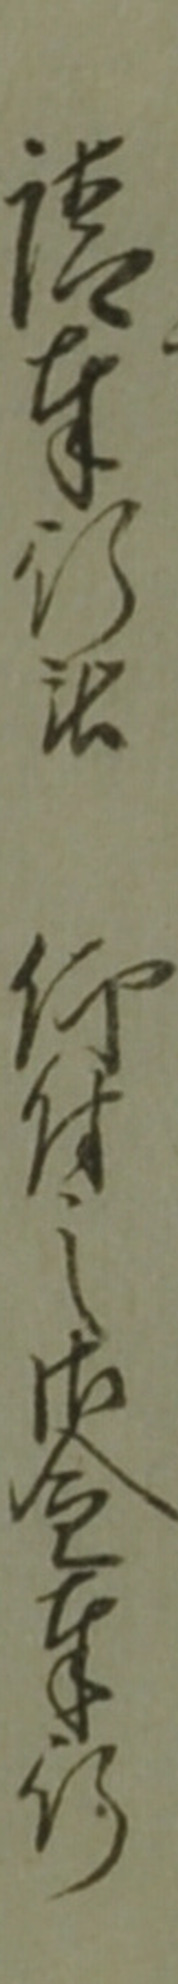請奉行被仰付之御金奉行
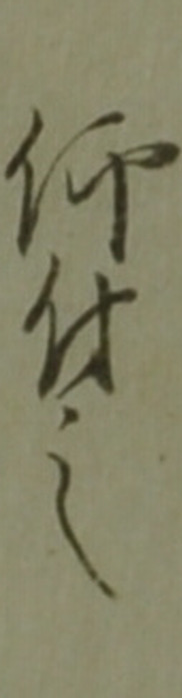仰付之
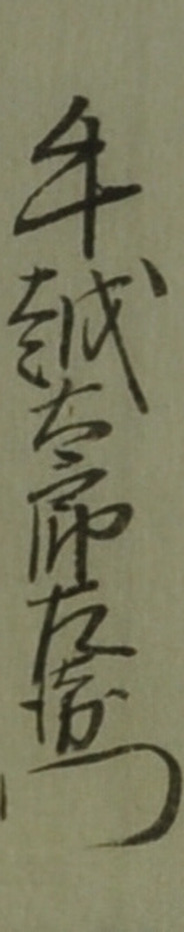手越太郎左衛門
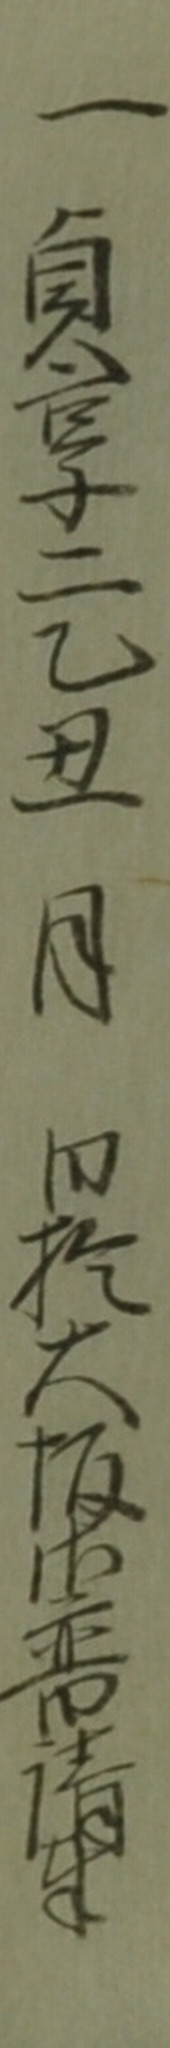一貞享二乙丑月日於大坂御普請奉
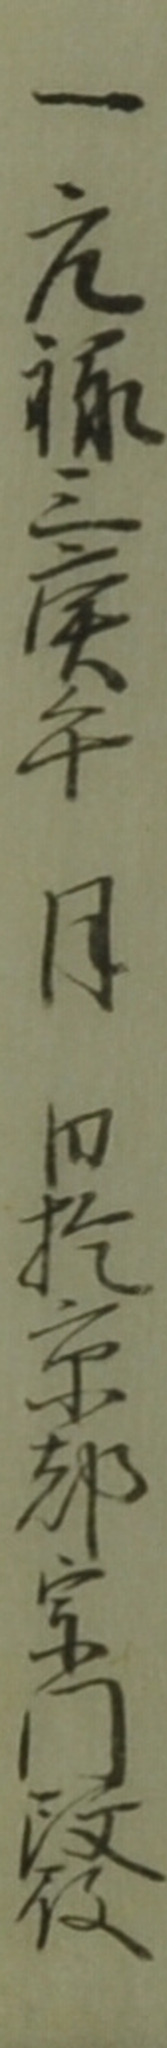一元禄三庚午月日於京都宗門改役
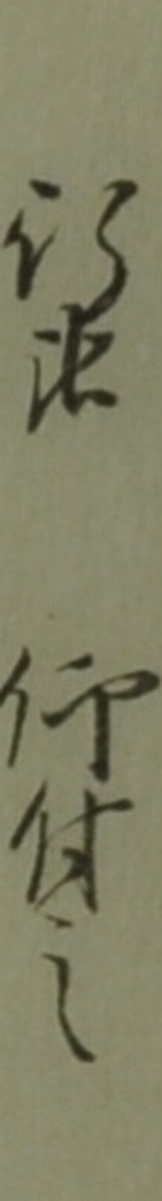行被仰付之
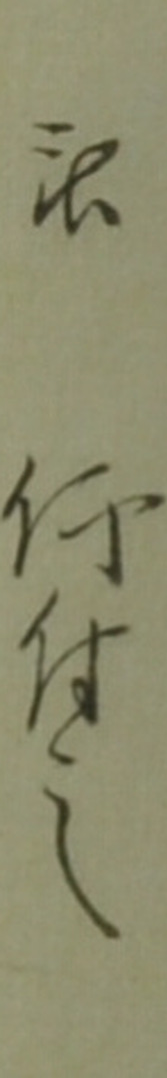被仰付之
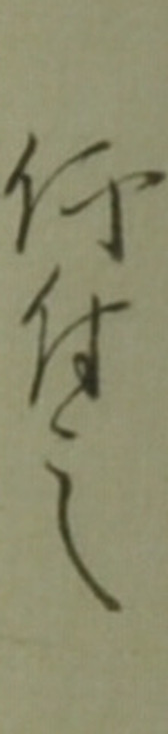仰付之

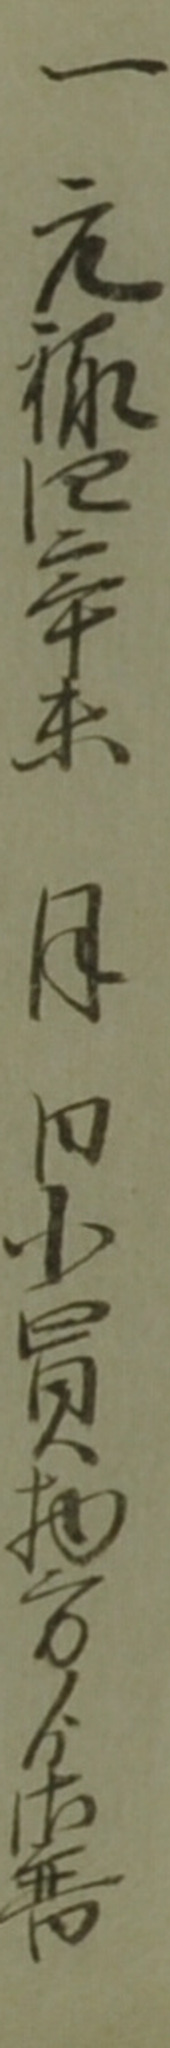一元禄四辛未月日小買物方ゟ御普
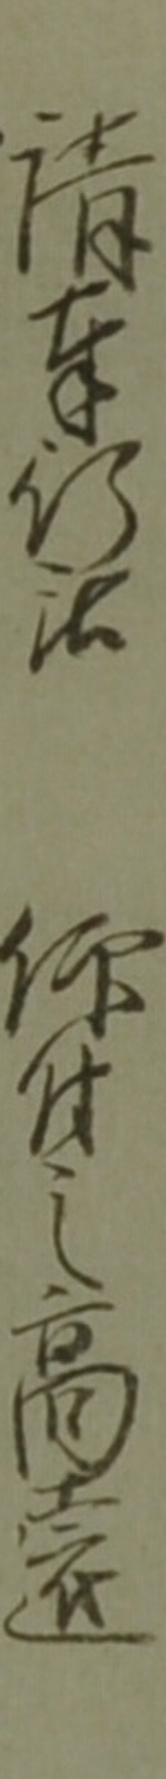請奉行被仰付之高遠
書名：諸御役代々録（六）
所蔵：伊那市立高遠町図書館・合同会社AMANE
